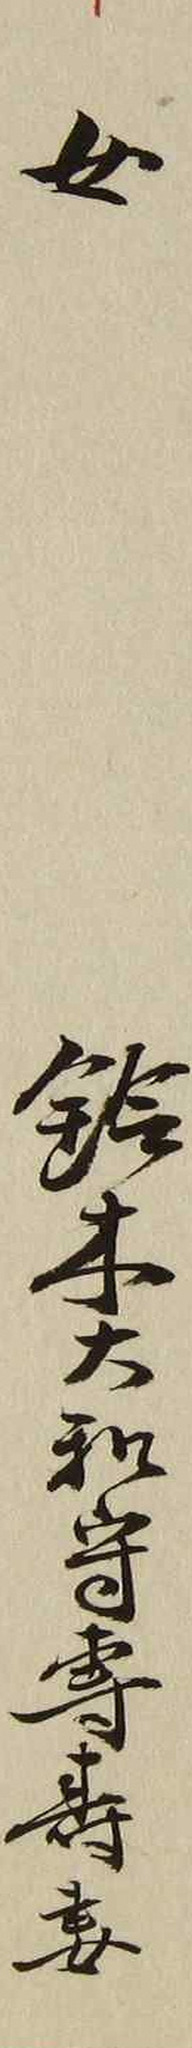女鈴木大和守専寿妻
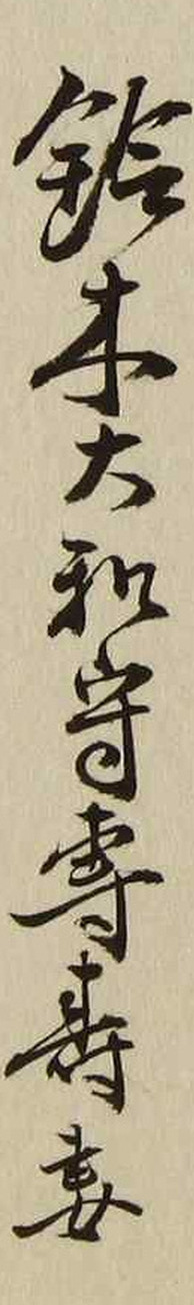女鈴木大和守専寿妻

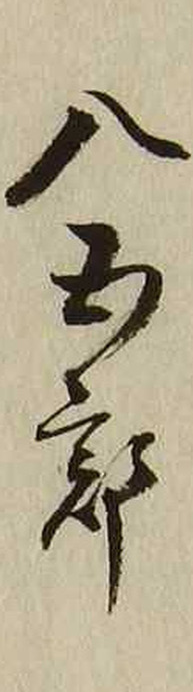八五郎
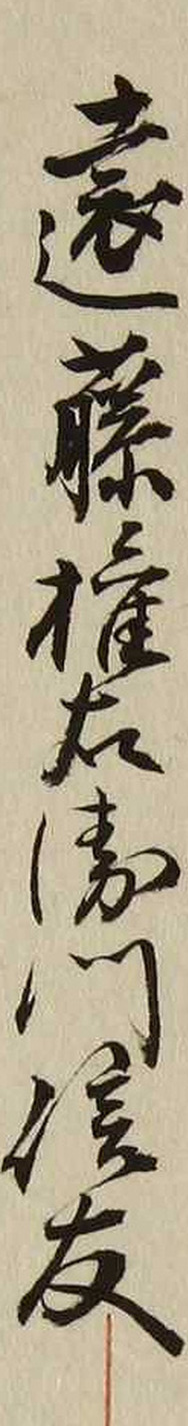遠藤権右衛門信友
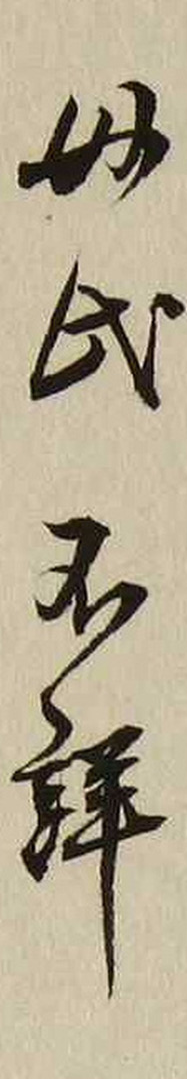母氏不詳
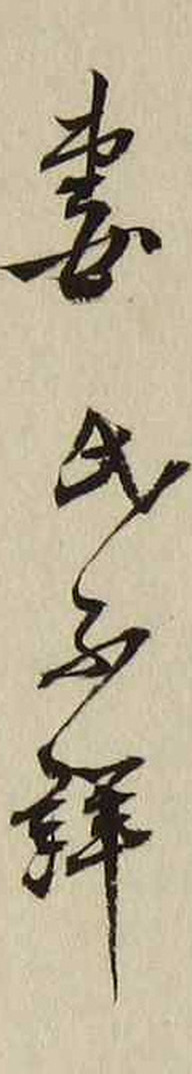妻氏不詳

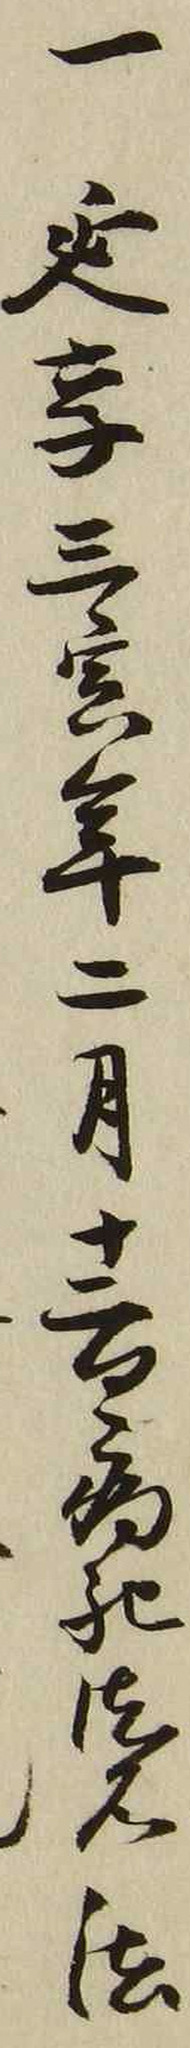一延享三寅年二月十二日病死法名法
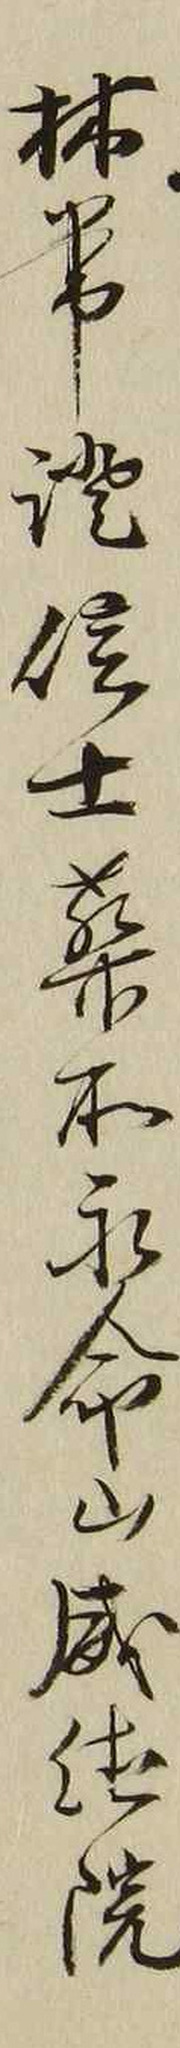林常證信士葬所永命山威徳院
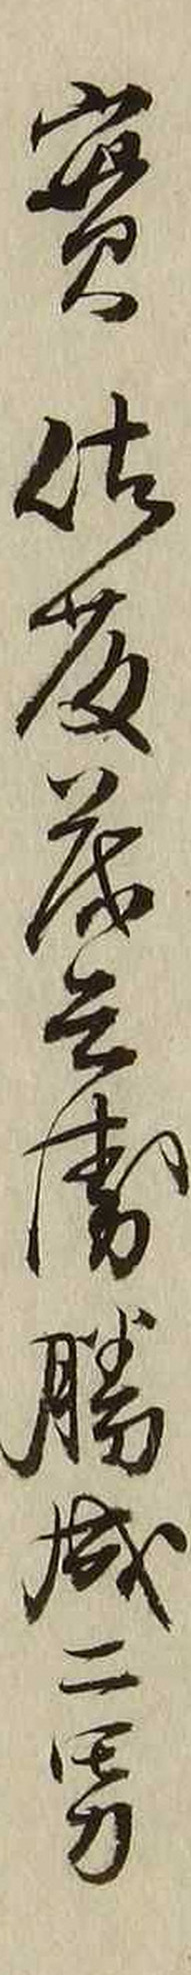実佐藤茂兵衛勝成二男
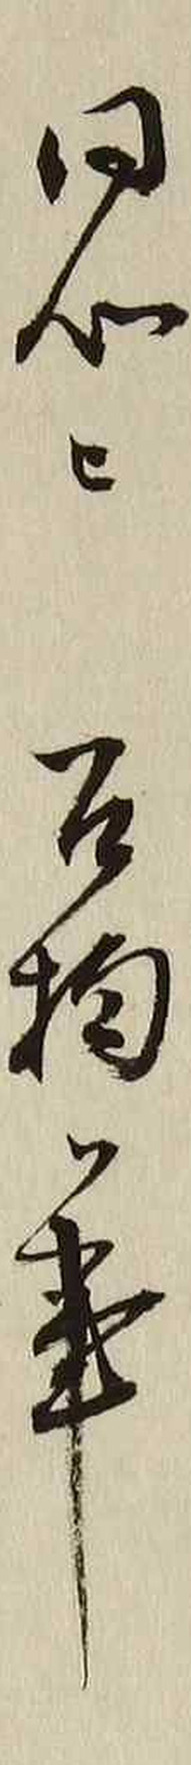同心被召抱候事
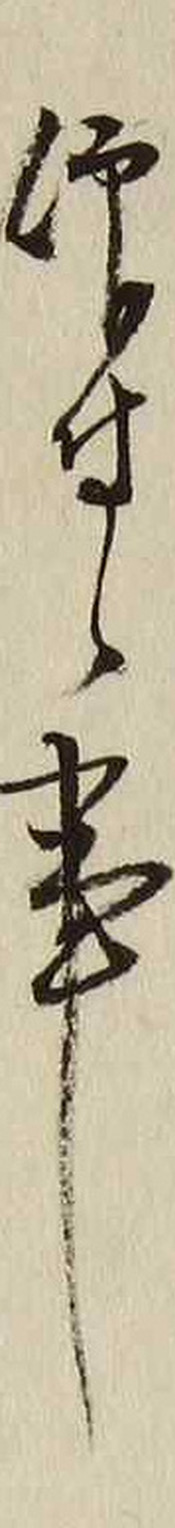仰付候事
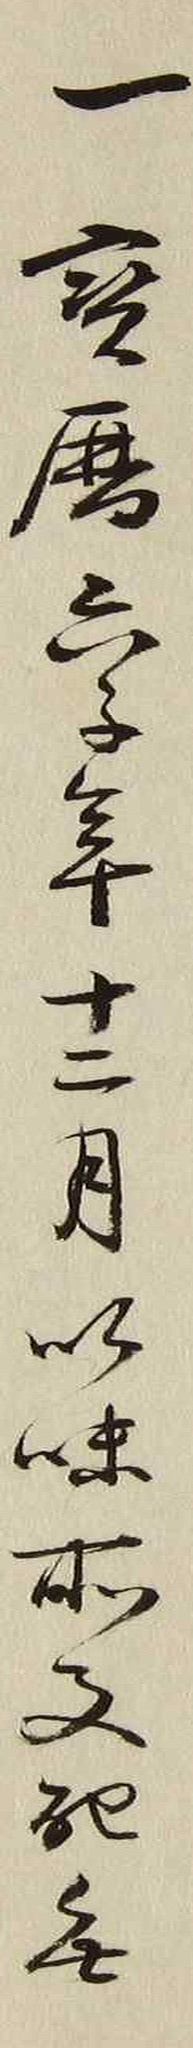一宝暦六子年十二月吟味所支配無
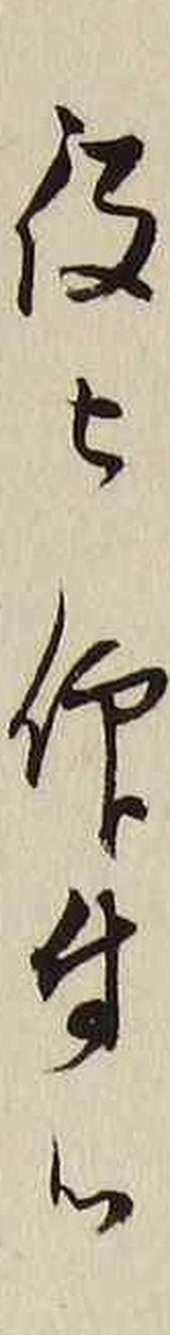役被仰付候
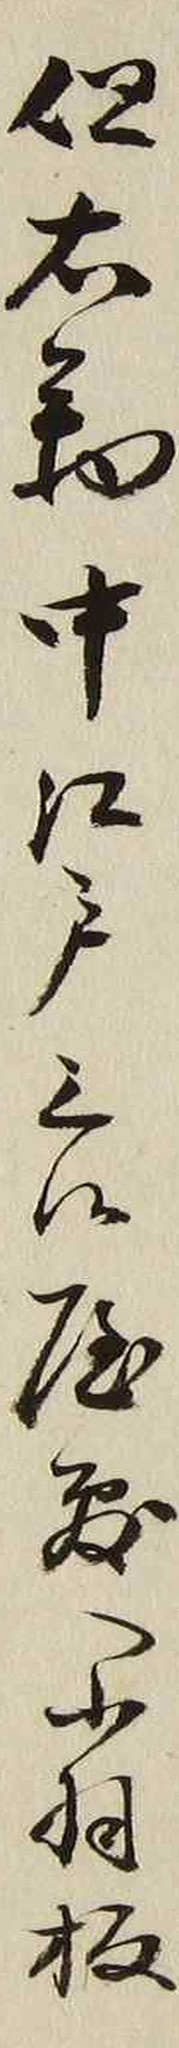但右勤中江戸上御屋敷へ小羽板
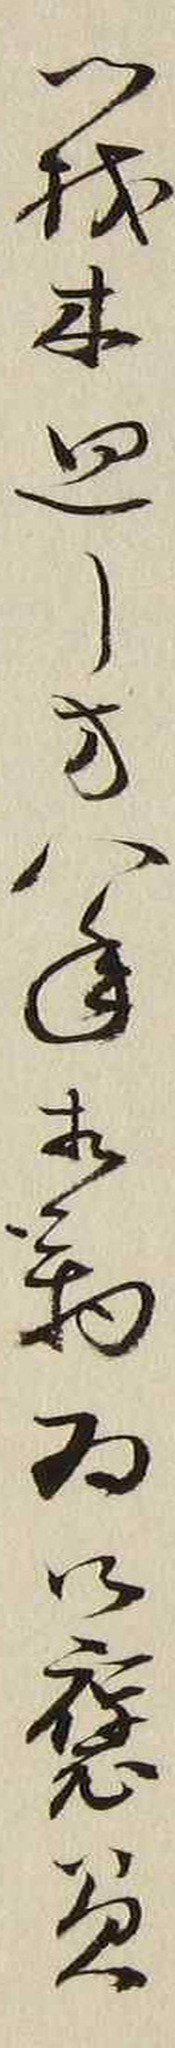御材木廻し方八年相勤為御褒美
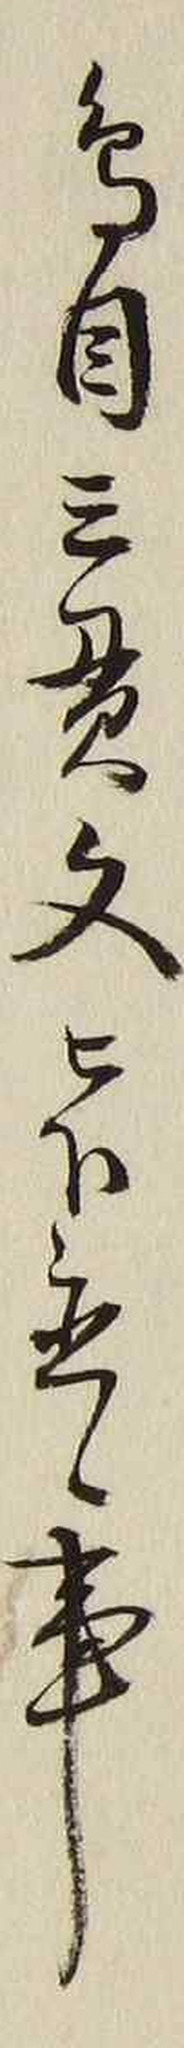鳥目三貫文被下置候事
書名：諸士系譜　巻之291　さ之部23
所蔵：会津若松市立会津図書館
